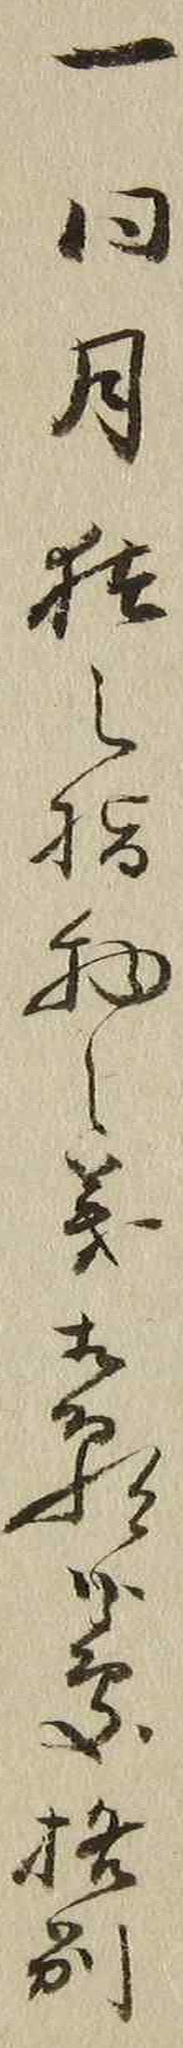一同月猪之指物之義相願候処格別
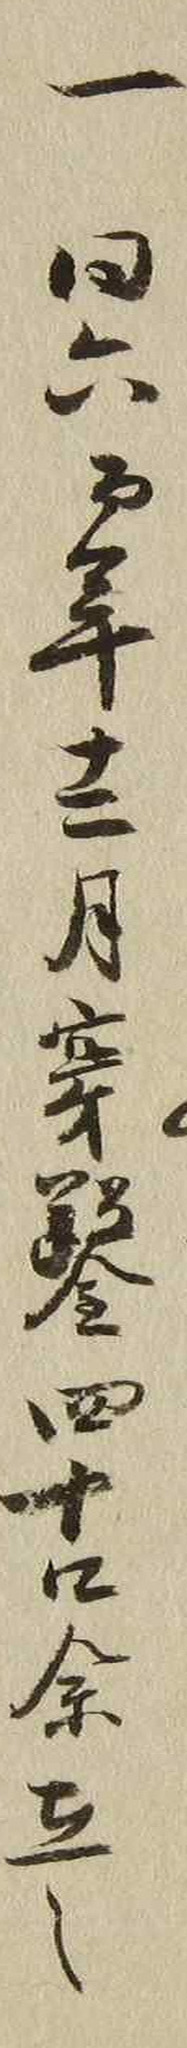一同六酉年十二月穿鑿四十口余在之
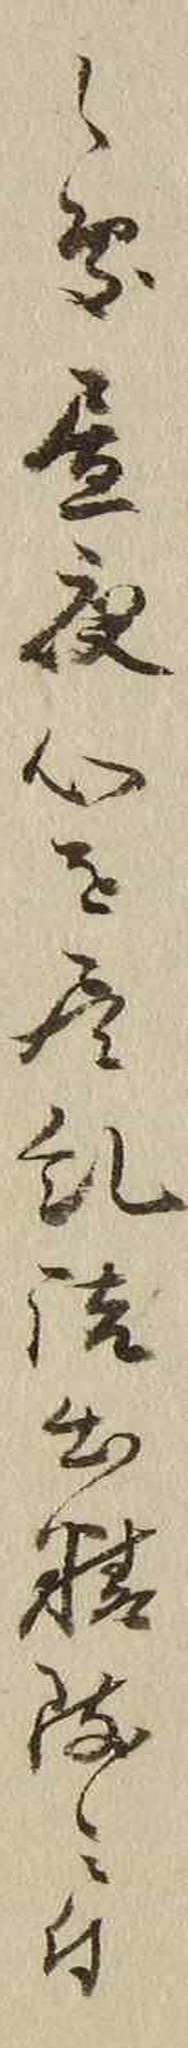之処昼夜心を尽糺詰出精致候ニ付
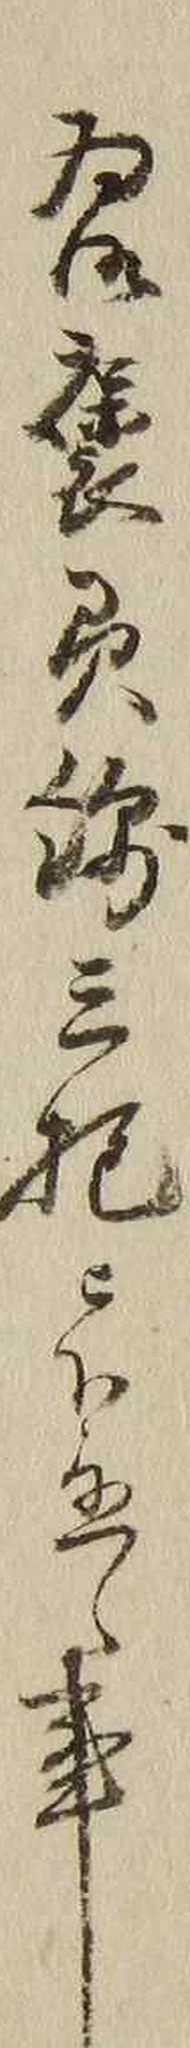為御褒美綿三把被下置候事
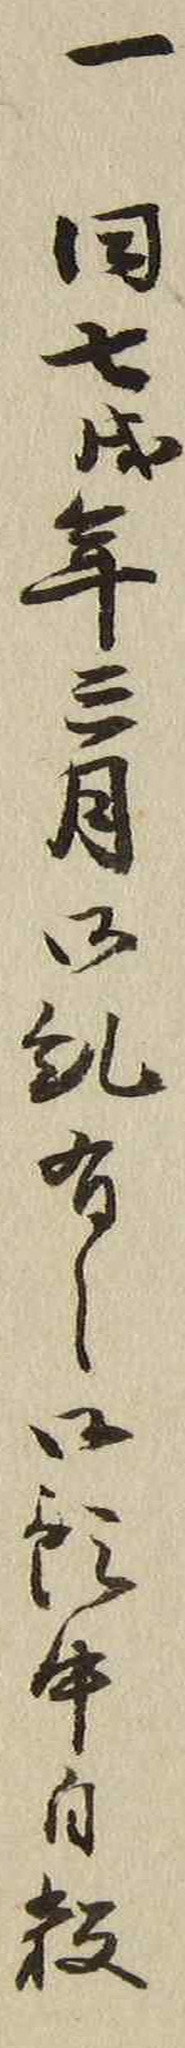一同七戌年三月御糺有之御預中自殺
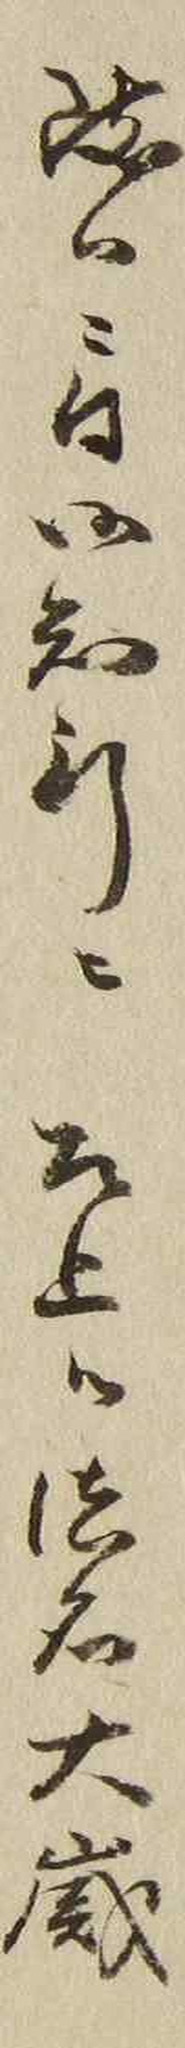致候ニ付御知行被召上候法名大歳
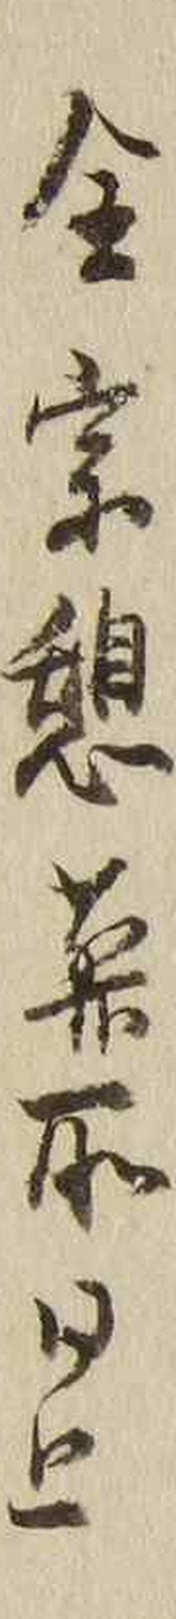全宗憩葬所同上

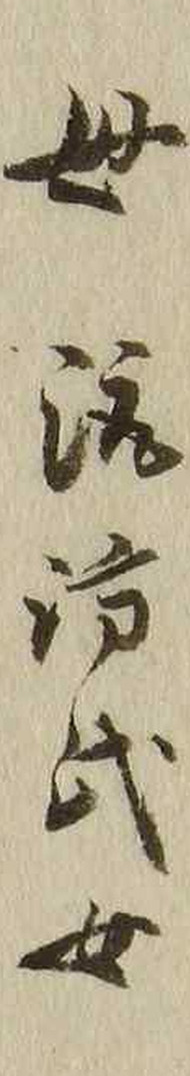母諏訪氏女
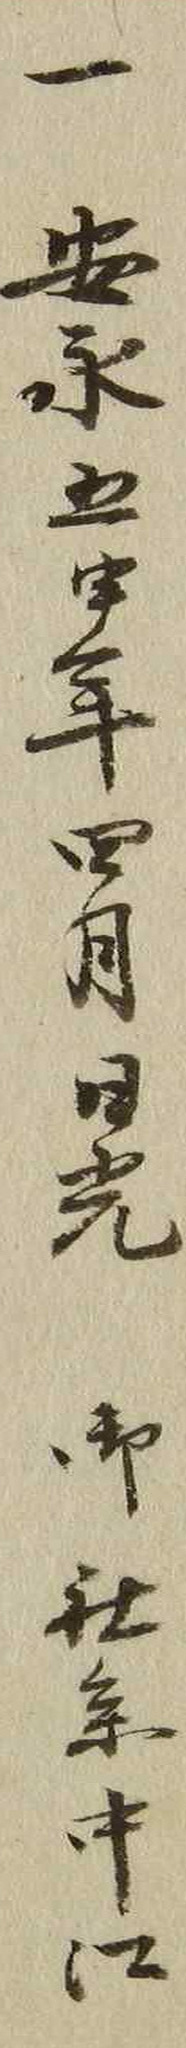一安永五申年四月日光御社参中江
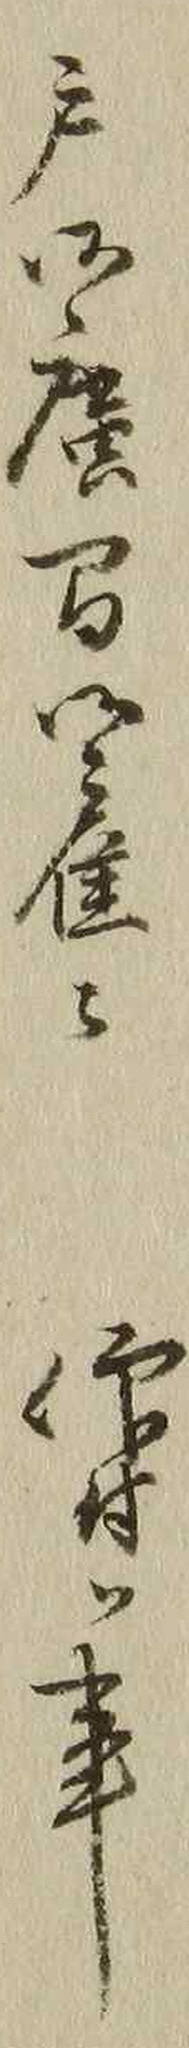戸御広間御雇被仰付候事
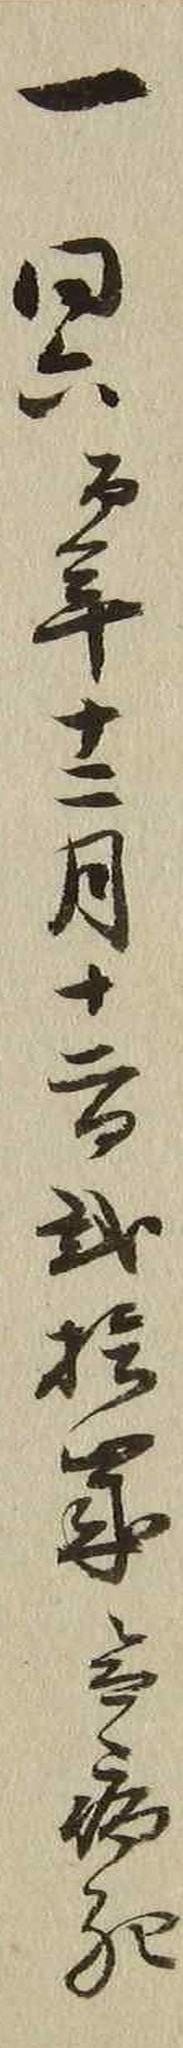一同六酉年十二月十二日弐拾歳ニ而病死
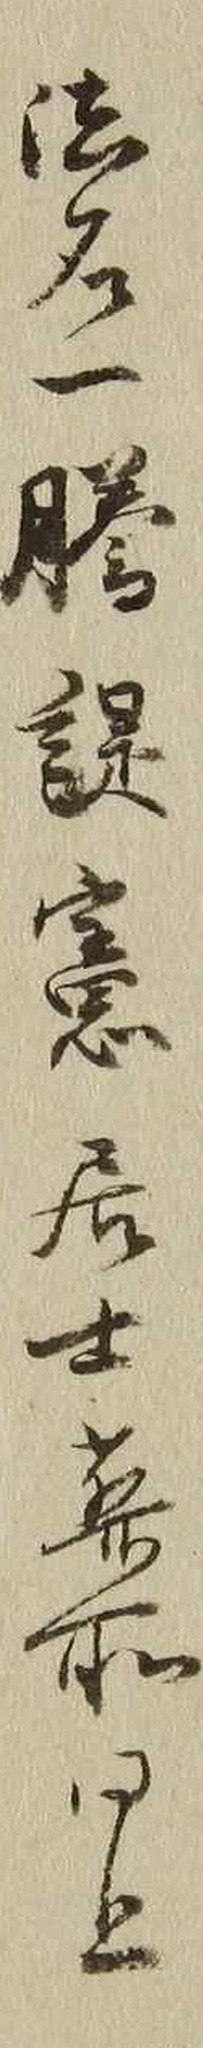法名一謄諟憲居士葬所同上
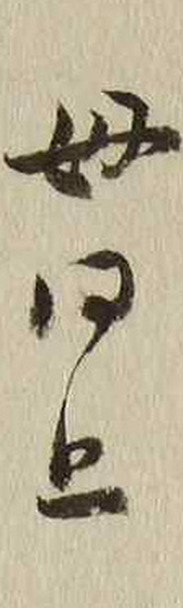母同上
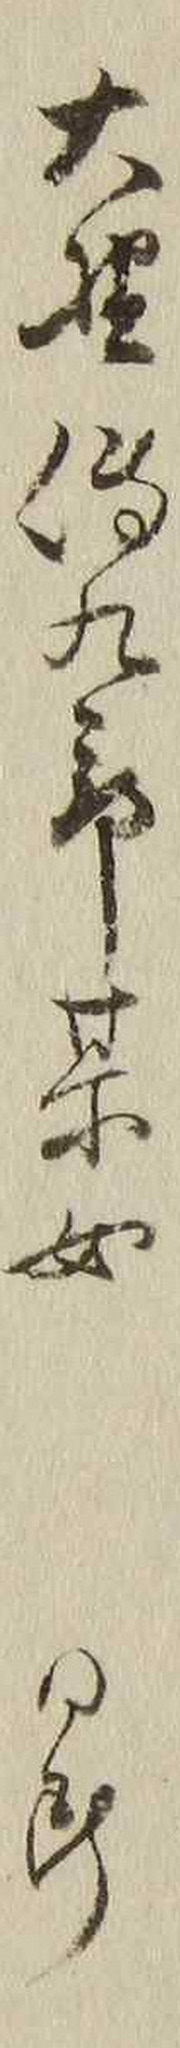大野伝九郎某女同断

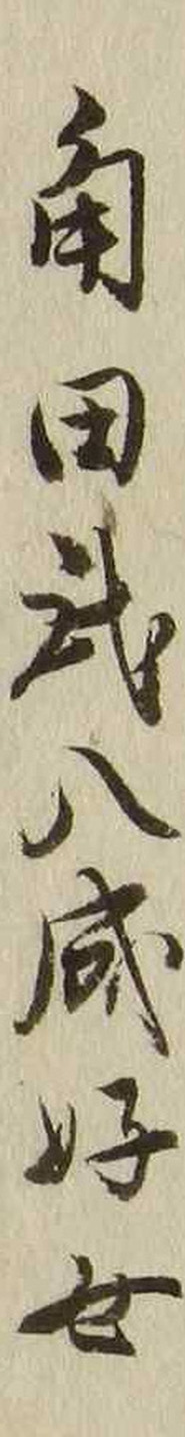角田武八咸好女
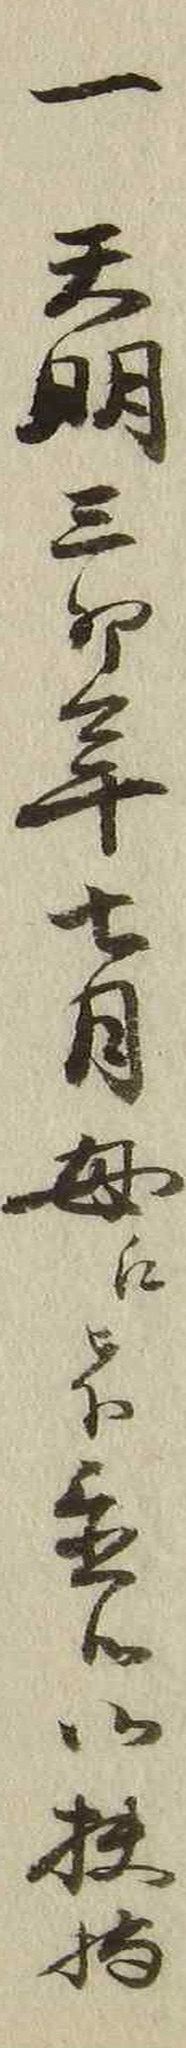一天明三卯年七月母江被下置候御扶持
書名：諸士系譜　巻之236　ふ之部4
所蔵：会津若松市立会津図書館
